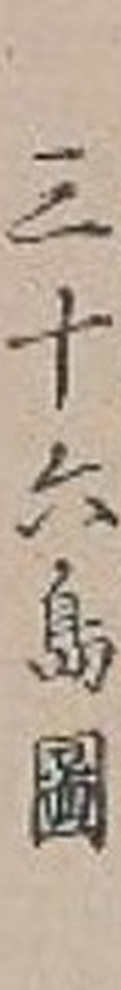三十六島図
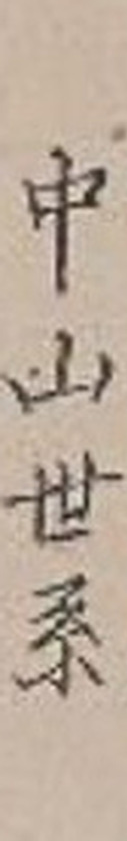中山世系
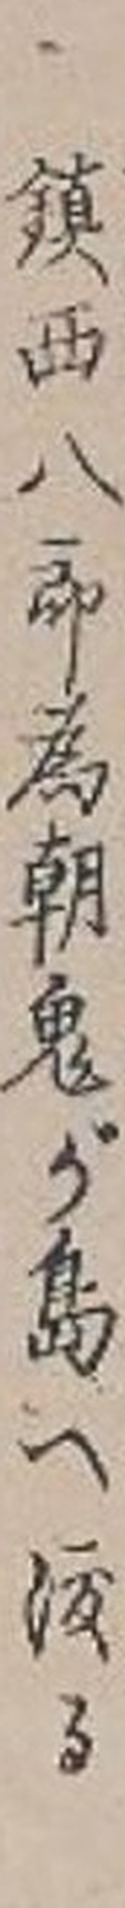鎮西八郎為朝鬼が島へ渡る
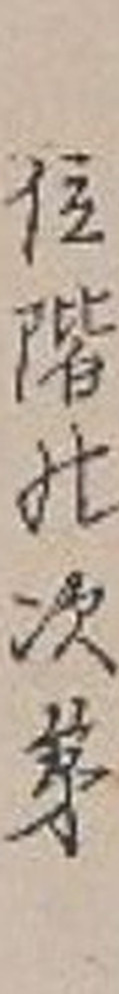位階の次第
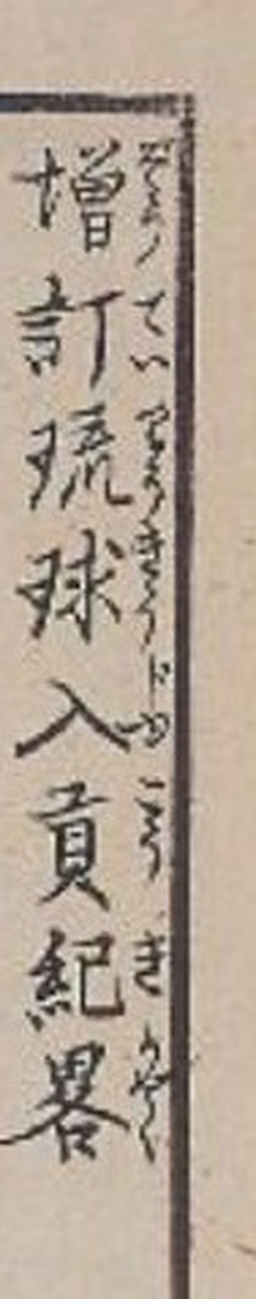増訂琉球入貢紀略
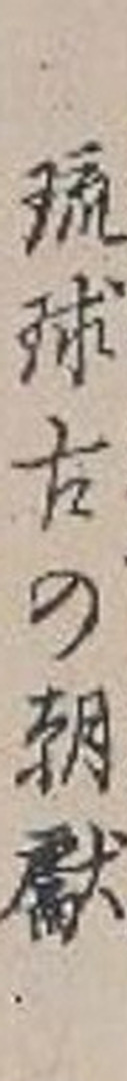琉球古の朝献
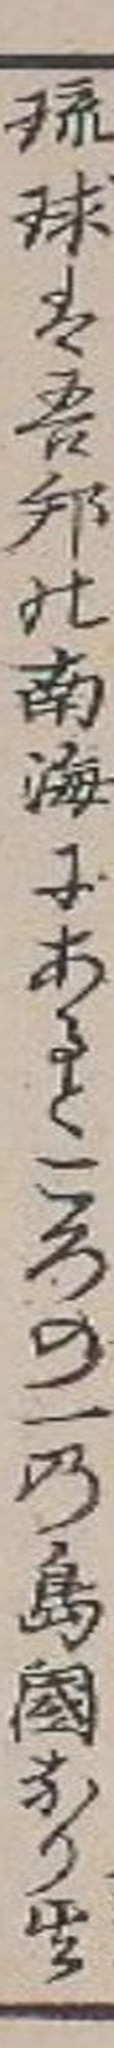琉球は吾邦の南海にあるところの一の島国なり、其
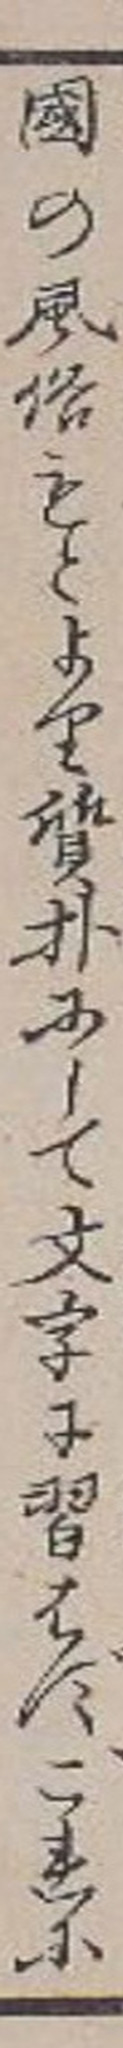国の風俗もとより質朴にして文字に習はず、これに
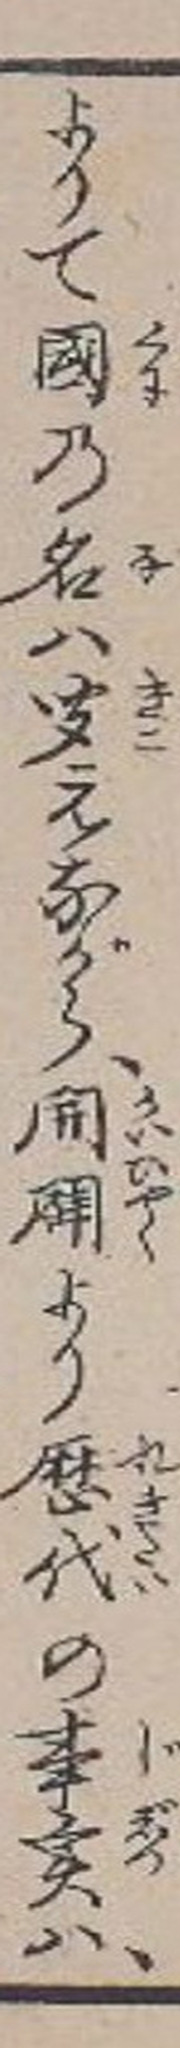よりて国の名は聞えながら、開闢より歴代の事実は、
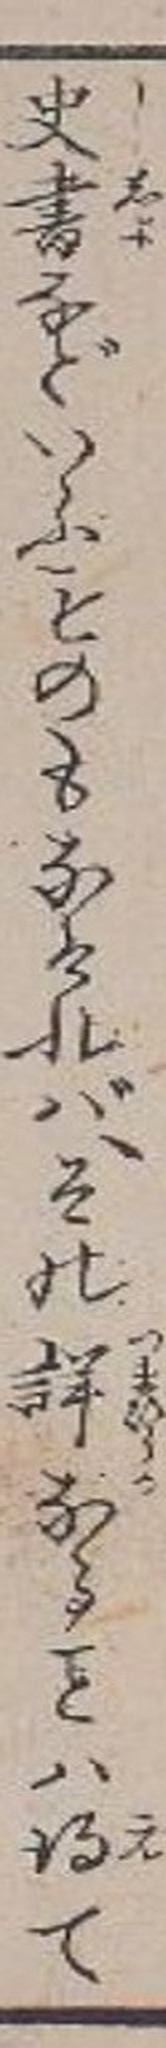史書などいふものもなければ、その詳なることは得て
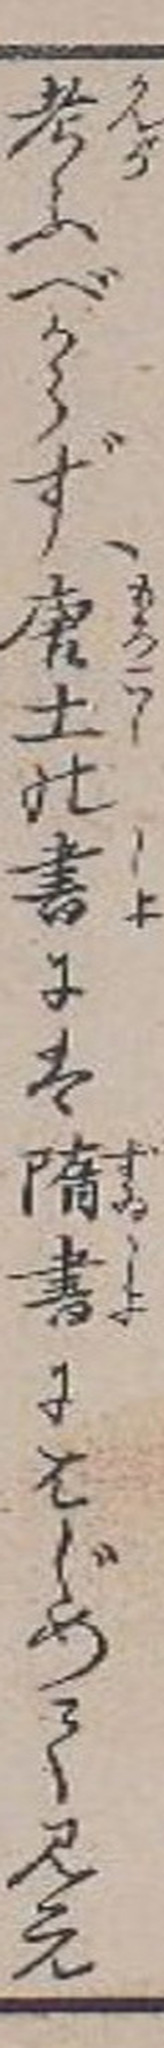考ふべからず、唐土の書には隋書にはじめて見え
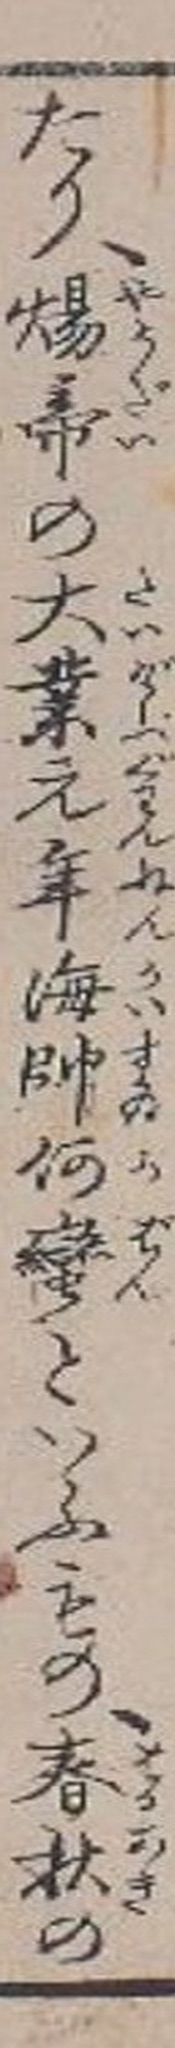たり、煬帝の大業元年海帥何蛮というもの、春秋の

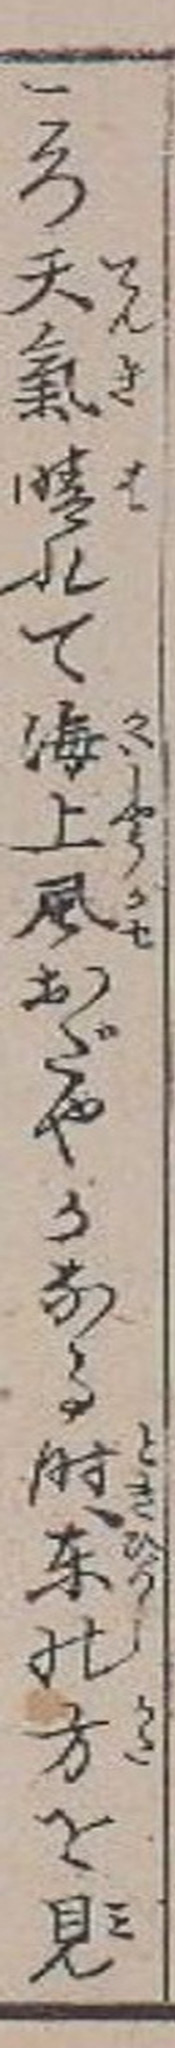ころ天気晴れて海上風おだやかなる時、東の方を見
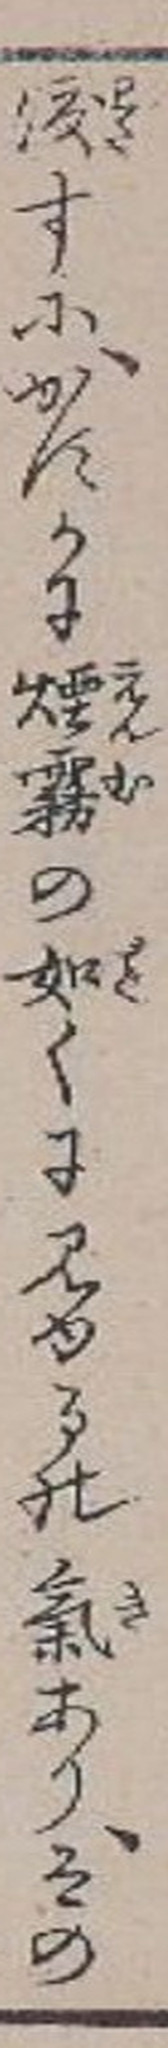渡すに、かすかに煙霧の如くに見ゆるの気あり、その
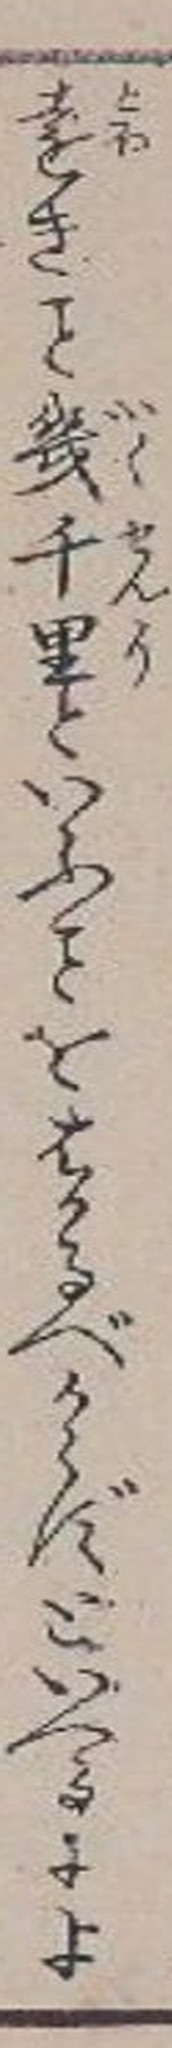遠きこと幾千里といふことをはかるべからずといへるによ
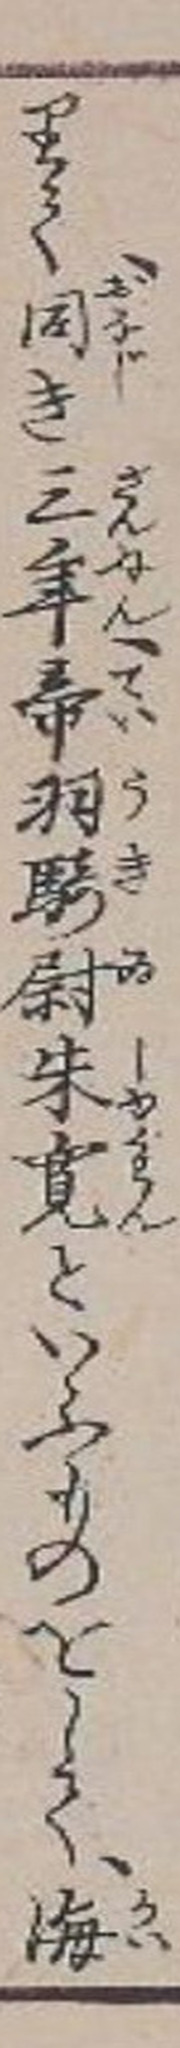りて、同き三年、帝羽騎尉朱寛といふものをして、海
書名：琉球入貢紀略
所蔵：University of the Ryukyus Library
